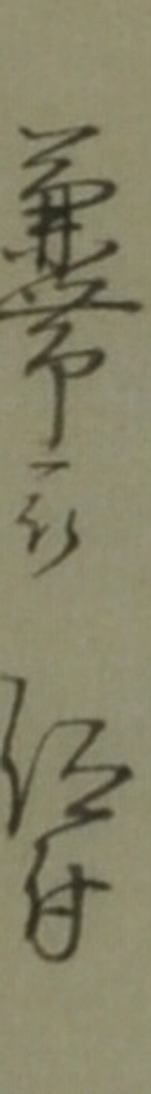兼帯被仰付
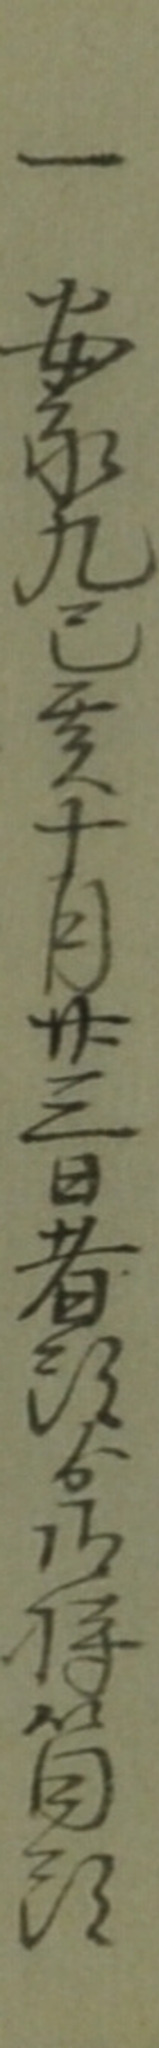一安永九己亥十月廿三日者頭ゟ御持筒頭
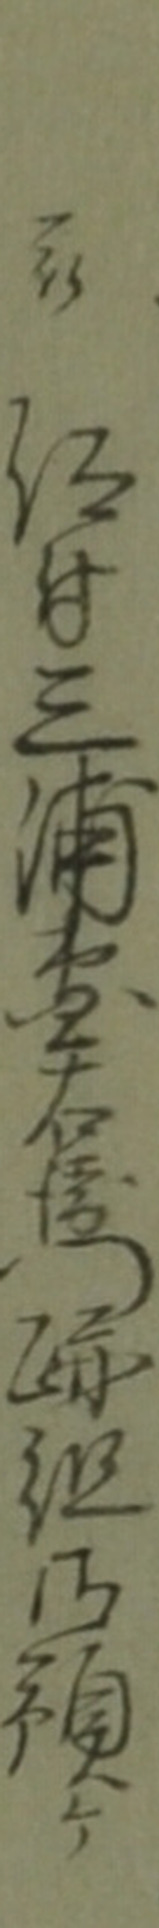被仰付三浦團右衛門跡組御預ヶ
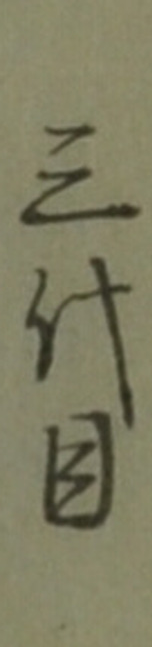三代目
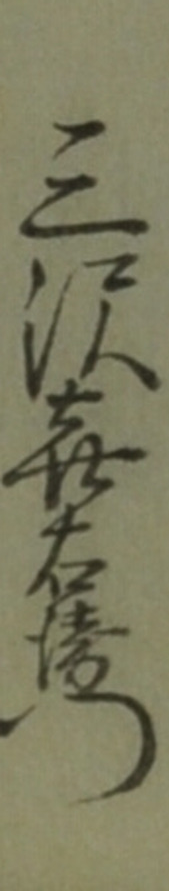三沢喜右衛門
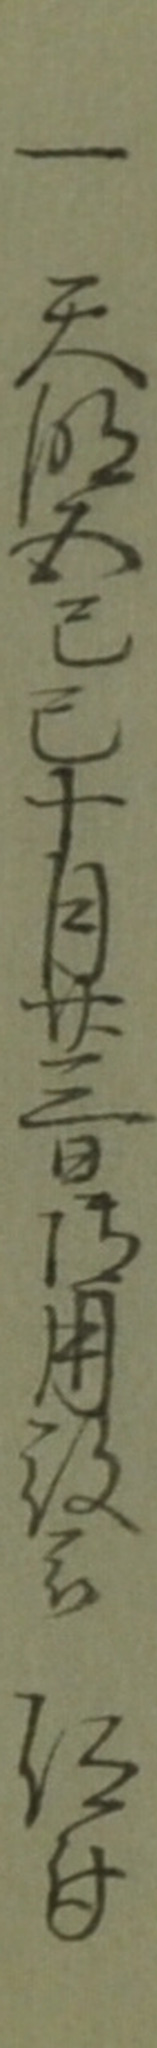一天明五己巳十月廿三日御用役被仰付
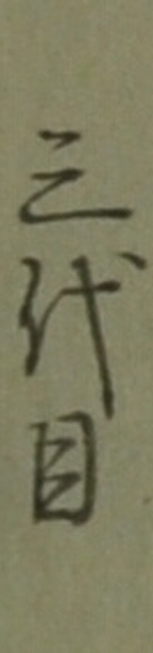三代目
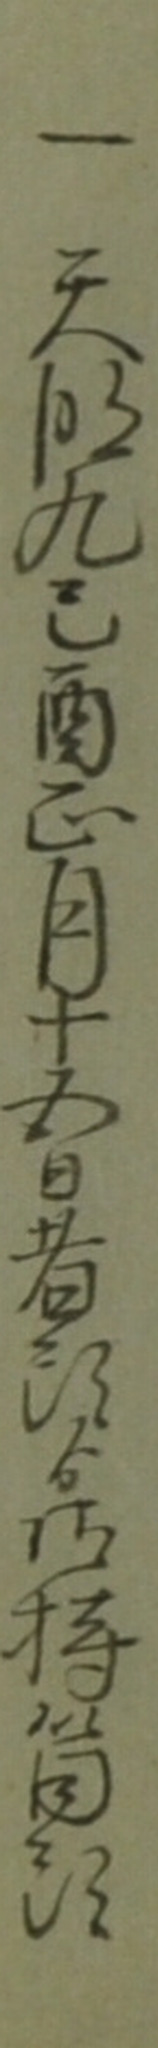一天明九己酉正月十五日者頭ゟ御持筒頭
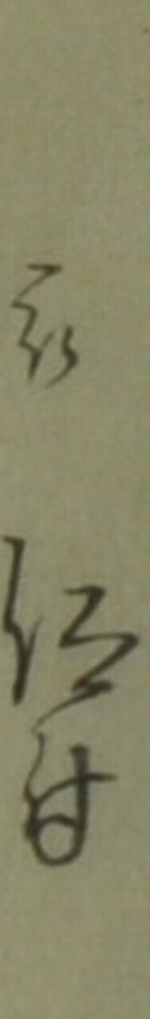被仰付
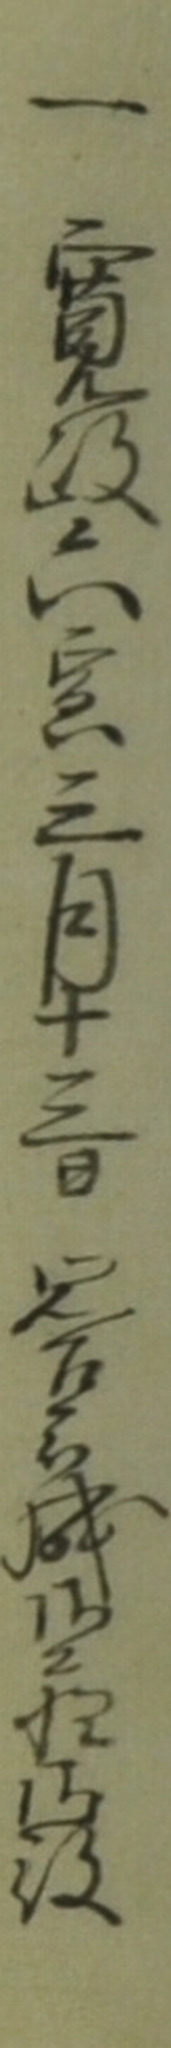一寛政六寅三月十三日思召被成御座御役
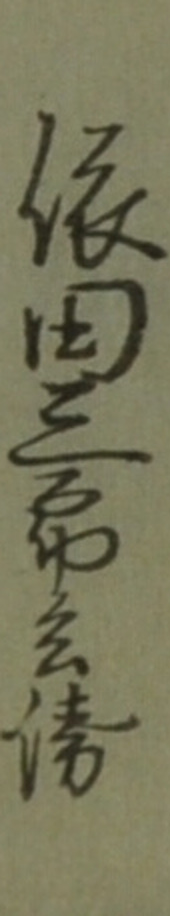依田三郎兵衛

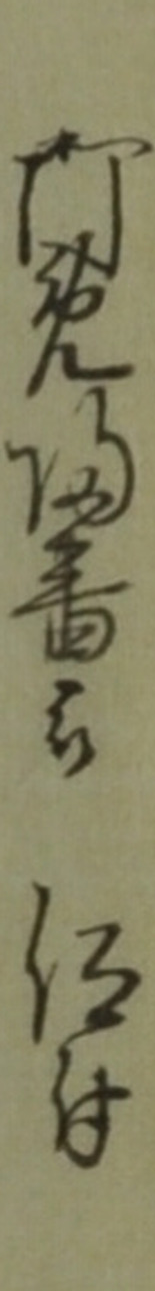御免帰書被仰付
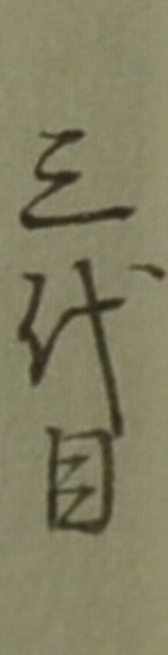三代目
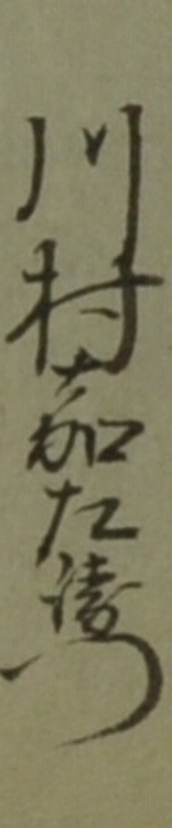川村嘉左衛門
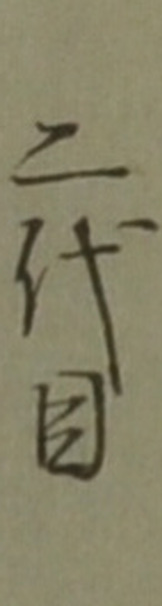二代目
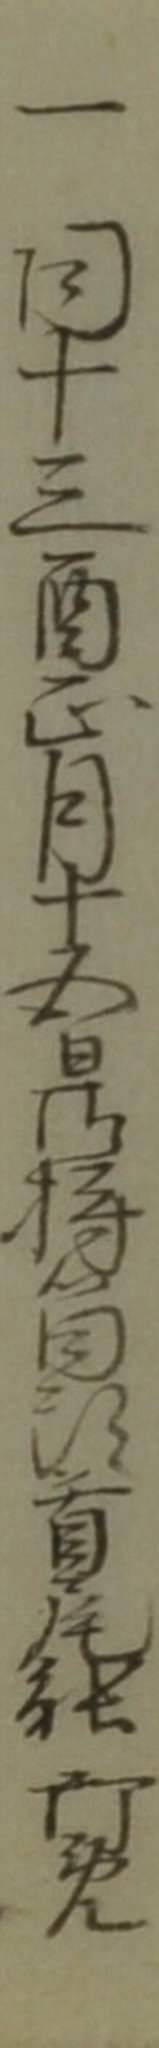一同十三酉正月十五日御持筒頭首尾能御免
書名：諸御役代々録（二）
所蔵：伊那市立高遠町図書館・合同会社AMANE
